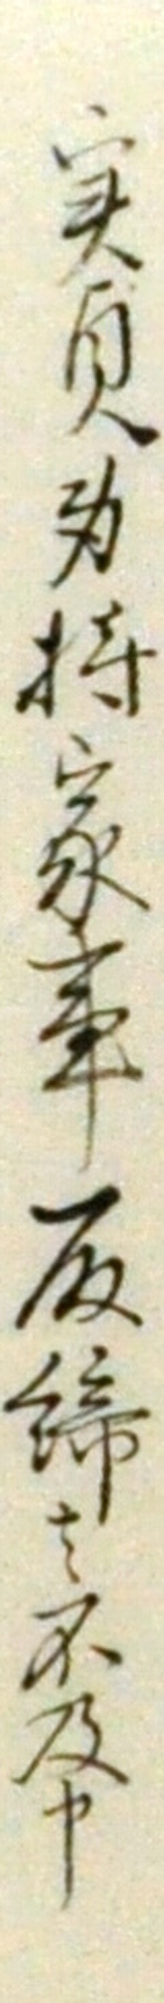実貞身持家事取締は不及申
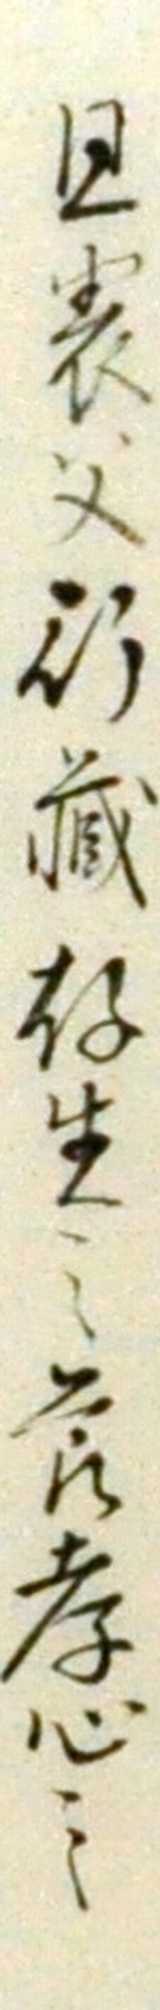且養父行蔵存生之節孝心之
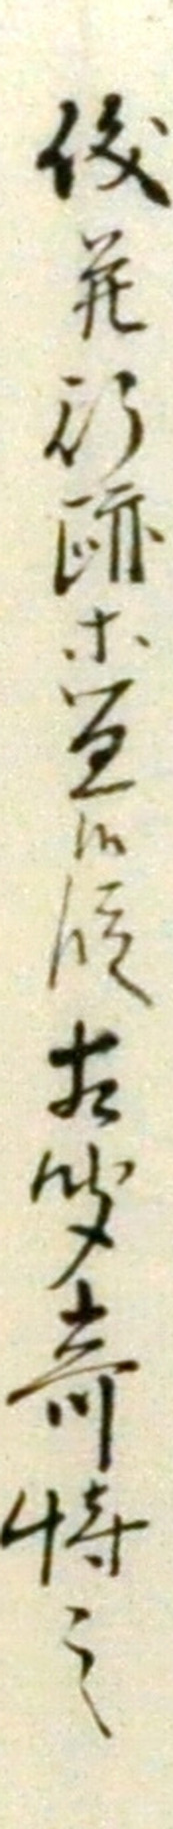儀并行跡等宜候段相聞奇特之
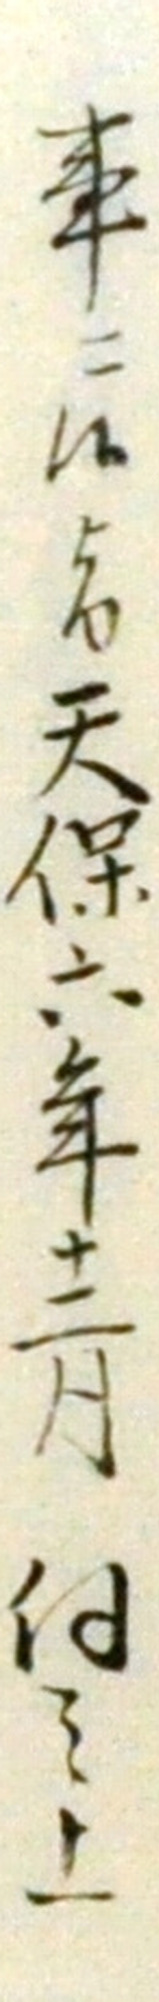事ニ候旨天保六年十二月伺之上
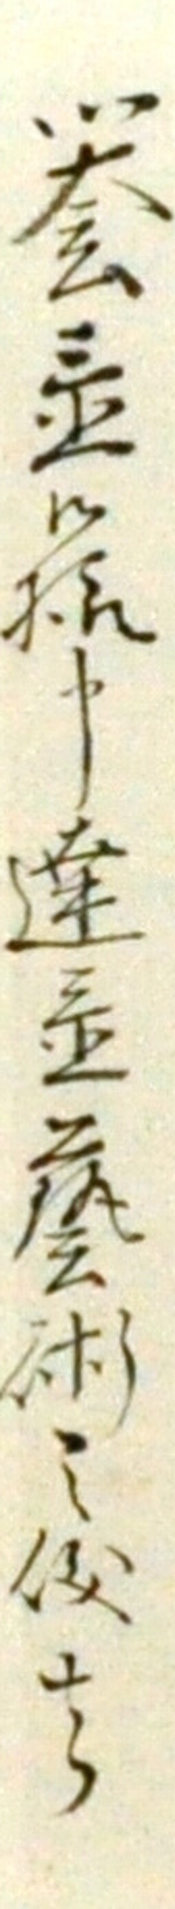誉置候様申達置芸術之儀者
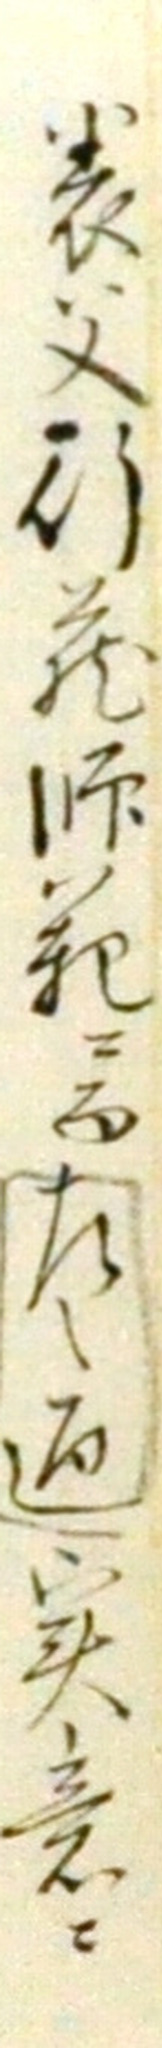養父行蔵師範ニ而左之通実意ニ
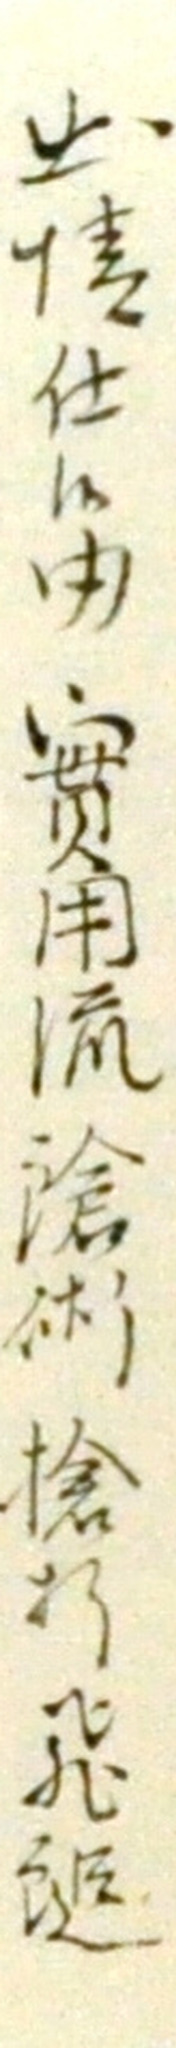出精仕候由実用流鎗術搶打飛鎚
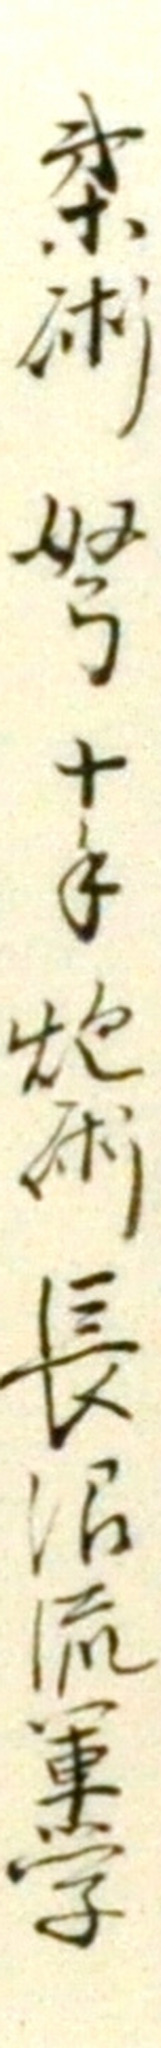柔術奴弓十手炮術長沼流軍学
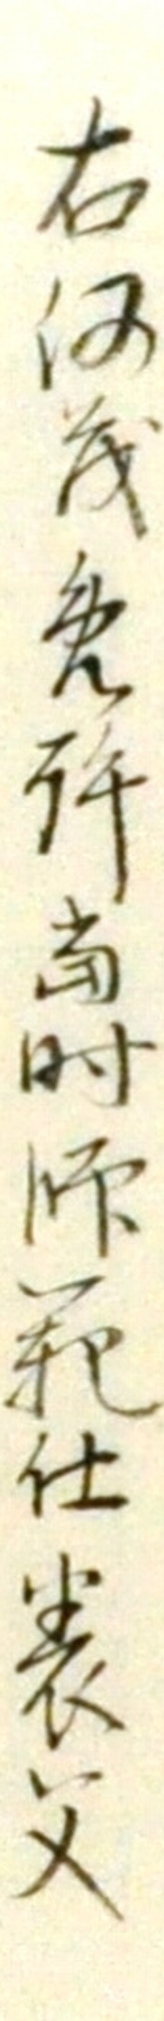右何も免許当時師範仕養父
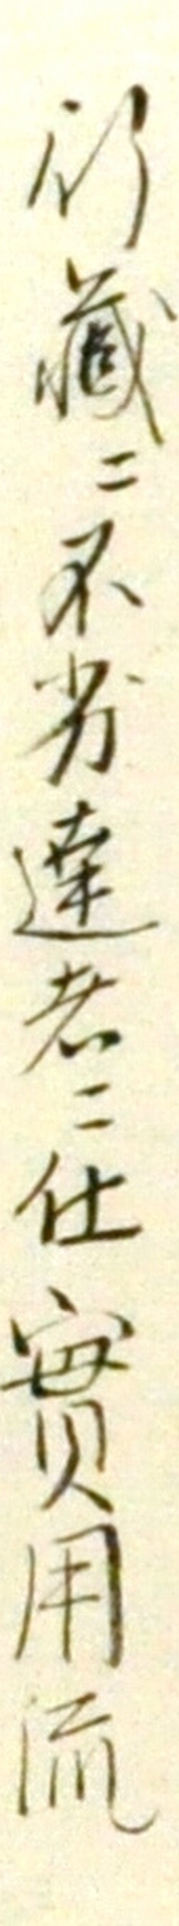行蔵ニ不劣達者ニ仕実用流
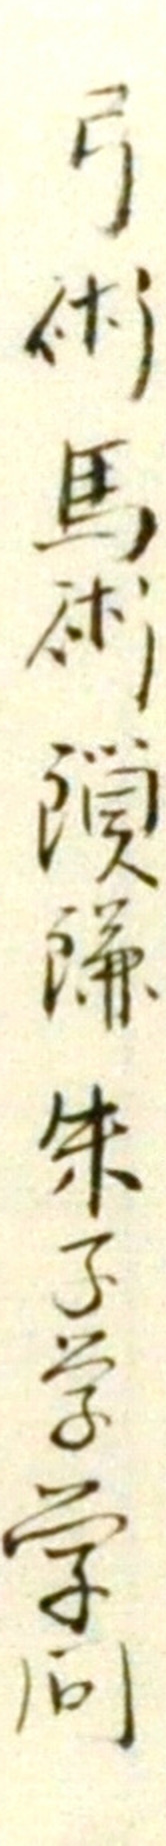弓術馬術鎖鎌朱子学学問
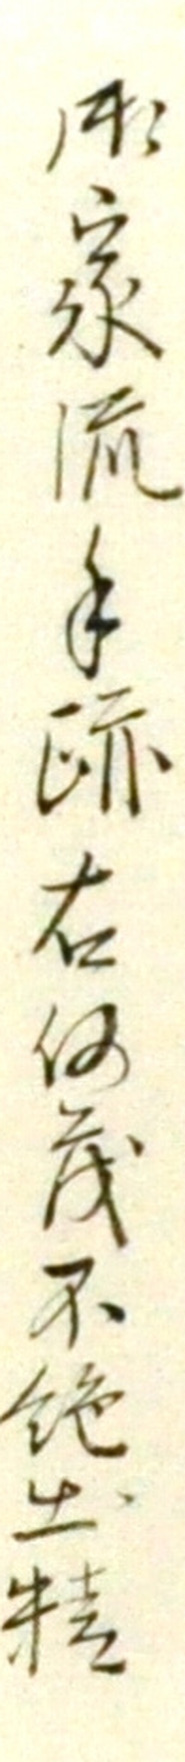御家流手跡右何も不絶出精
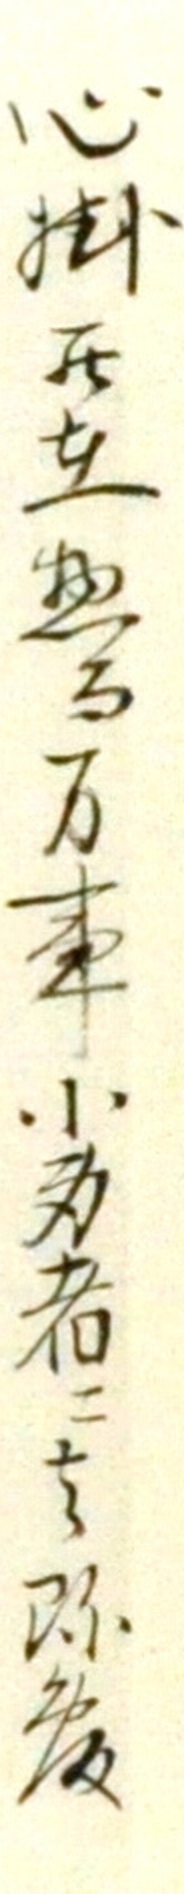心掛罷在惣而万事小身者ニは珍敷
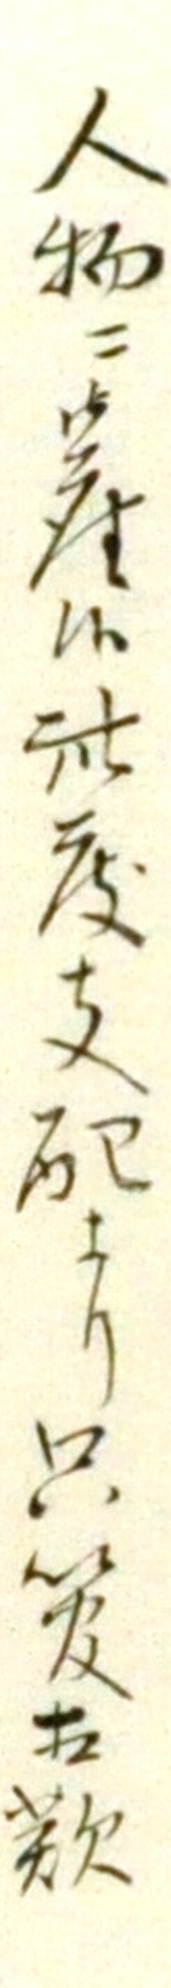人物ニ御座候此度支配より只管相歎
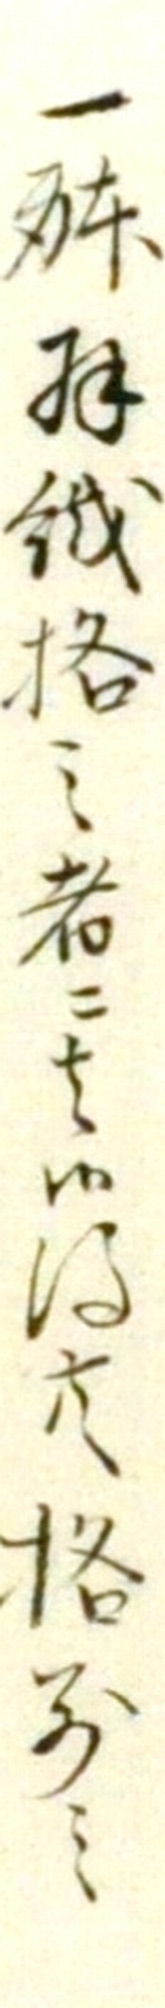一躰羽織格之者ニは候得共格別之
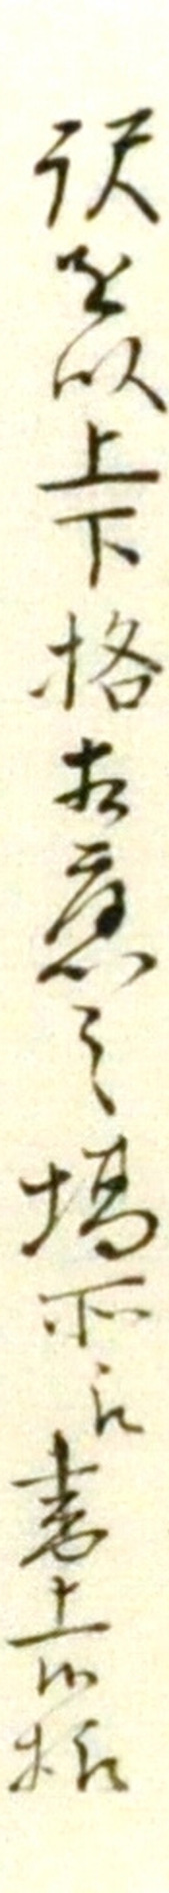訳を以上下格相応之場所江書上候様
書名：下案・西丸火之番調
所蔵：伊那市立高遠町図書館・合同会社AMANE
